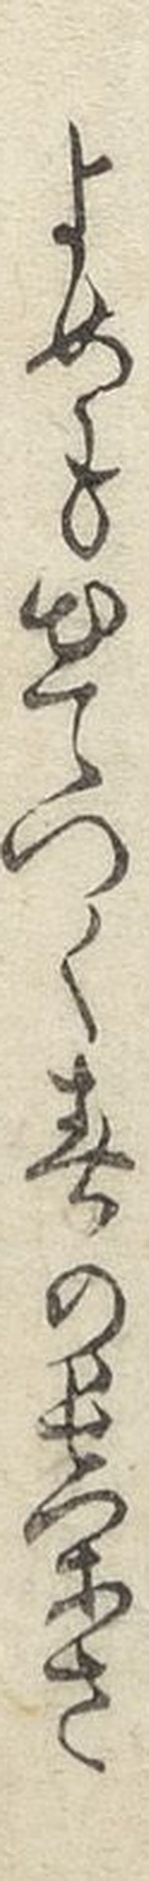よめも出てつく春の長閑さ
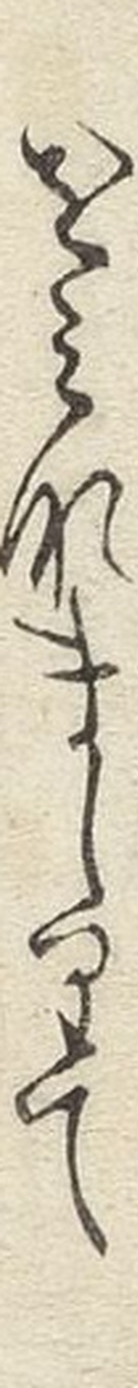おみなましりて
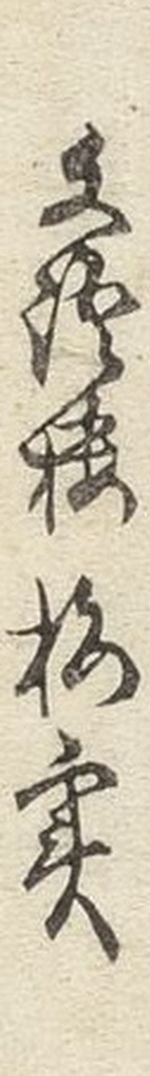文語楼梅実
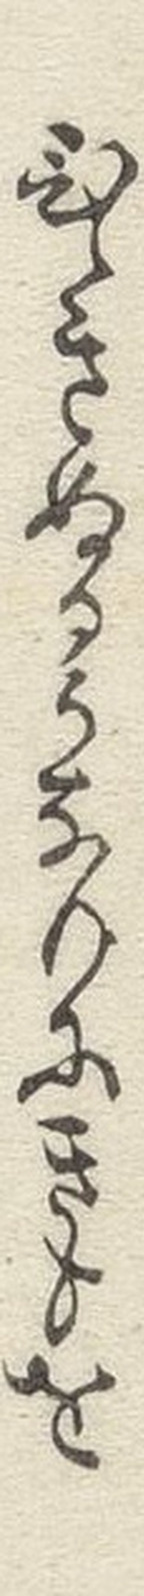ひゝきぬるうなりにきもを
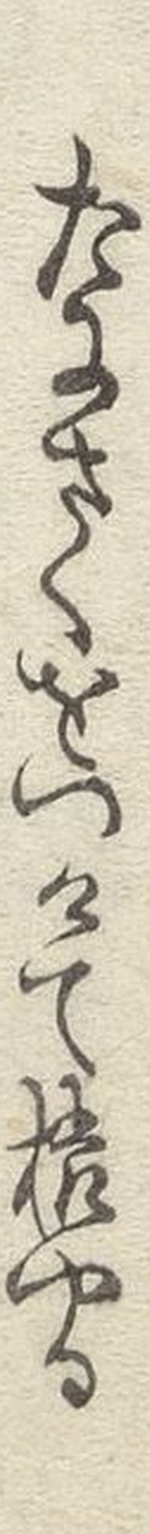たにさくをつけて？やる
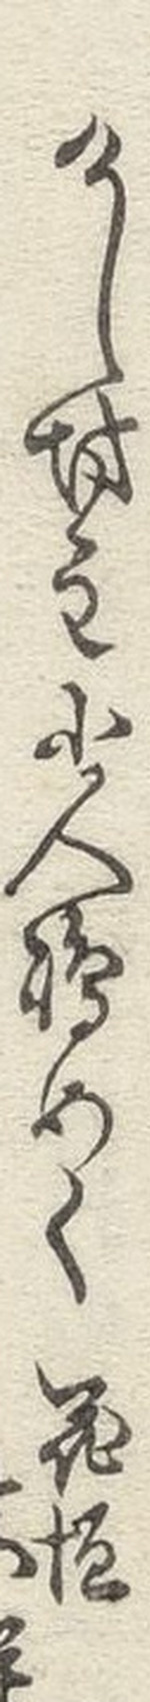けし坊主小人嶋めく花垣
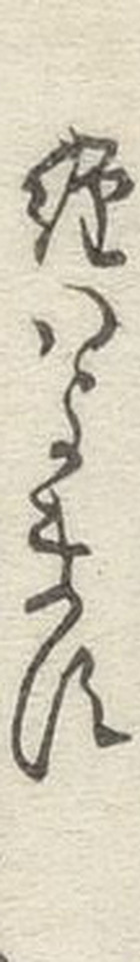経はよます
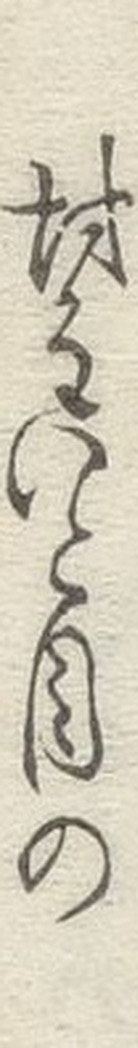坊主いと目の
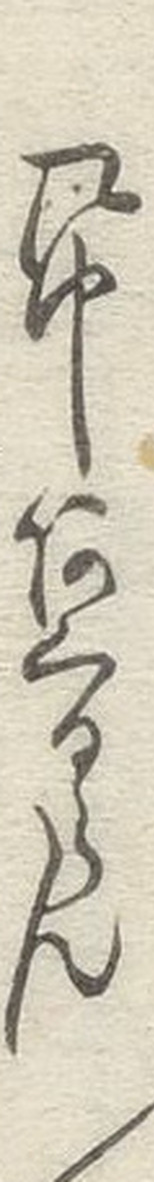凧あくるらん
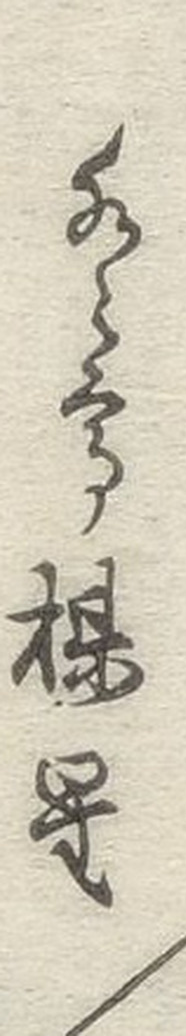水々亭楳星
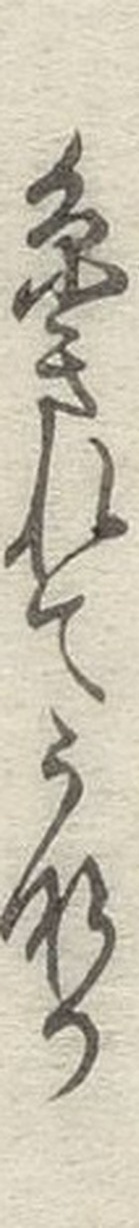糸きれてうな
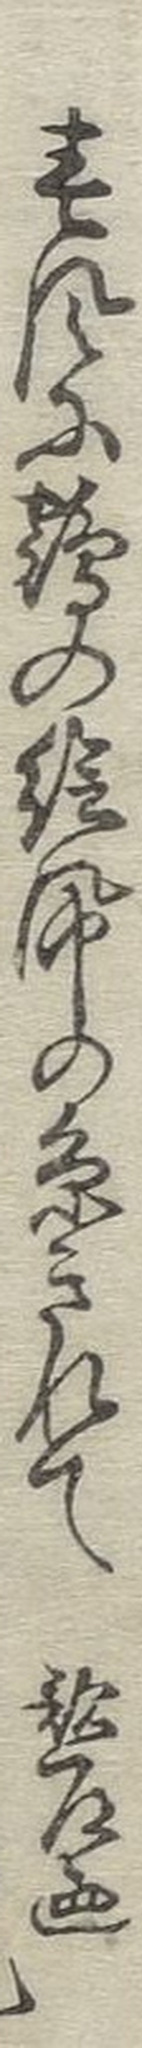春風に鶴の絵凧の糸きれて歌道廼
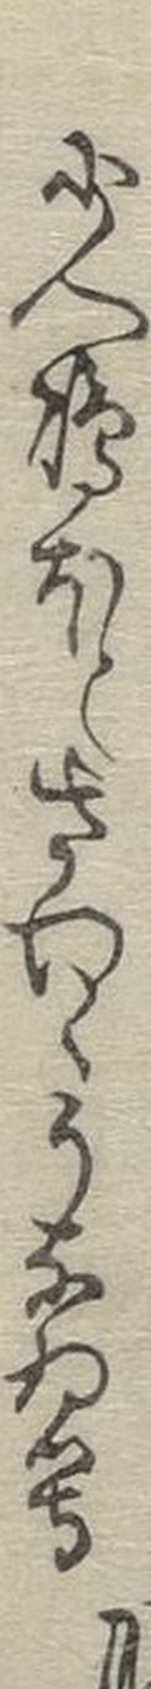小人嶋ほとさわくうなゐ等晴記

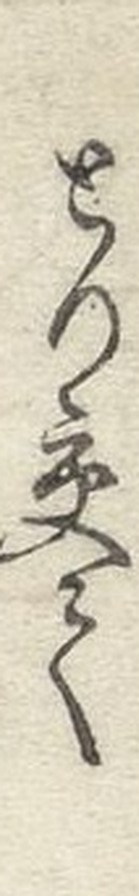とり交て
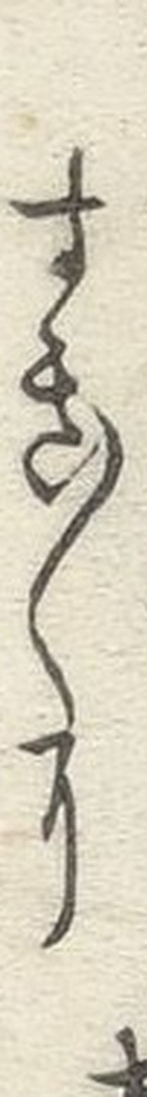すき〳〵に
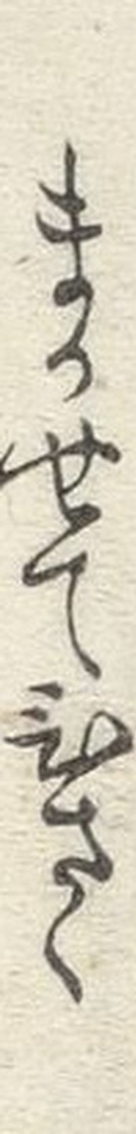かせてひさく
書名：Picture Album of People with Kyōka (Light Verse) (Kyōka shiki jinbutsu 狂歌四季人物)
